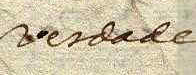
verdade
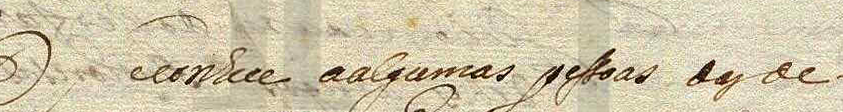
Se conhece a algumas pessoas das de
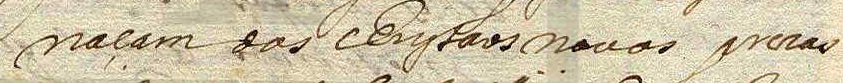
naçam dos christaos nouos prezas
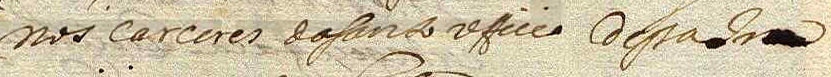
nos carceres do santo officio desta In
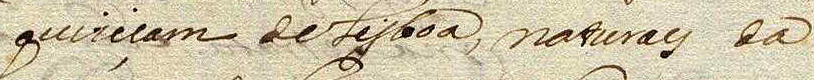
quiziçam de Lisboa, naturaes da
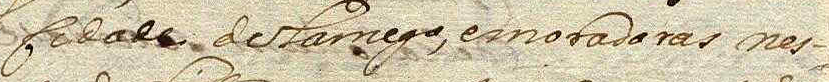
Cidade de Lamego, e moradoras nes
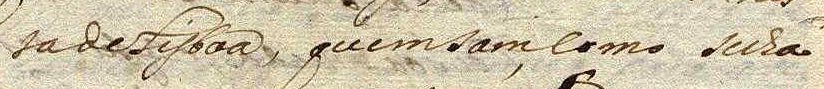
ta de Lisboa, quem sam, como se cha
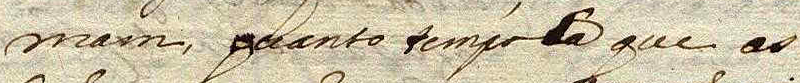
mam, quanto tempo ha que as
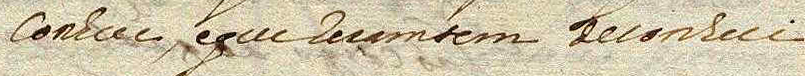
conhece, e que Rezam tem de conheci
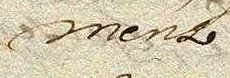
mento
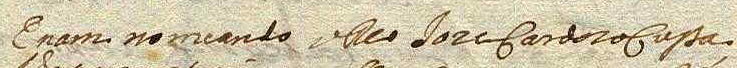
E nam nomeando o Reo Ioze Cardozo Costa
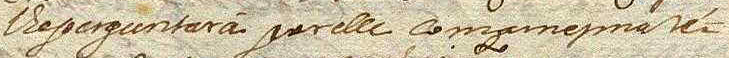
lhe perguntará por elle com a mesma vi
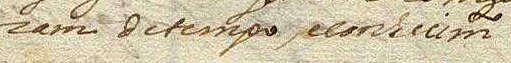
zam de tempo, e conhecimto
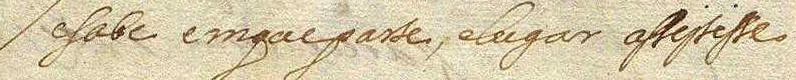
Se sabe em que parte, e lugar assistisse
